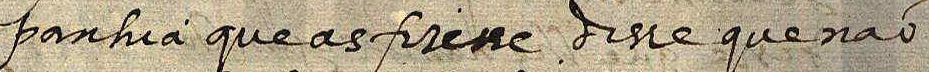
panhia que as fizesse. disse que não
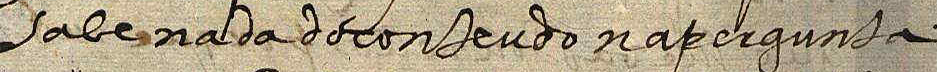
sabe nada do conteudo na pergunta.
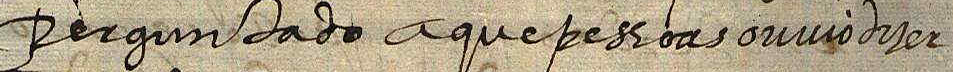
Perguntado a que pessoas ouuio dizer
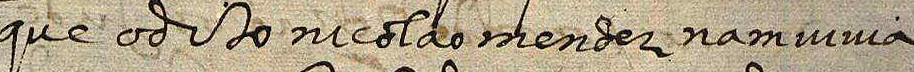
que o dito nicolao mendez nam uiuia
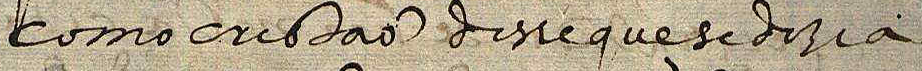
como cristaõ disse que se dizia
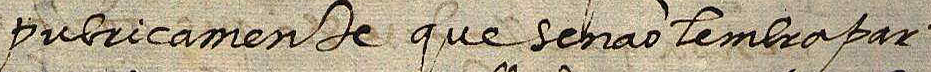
pubricamente que senaõ lembra par
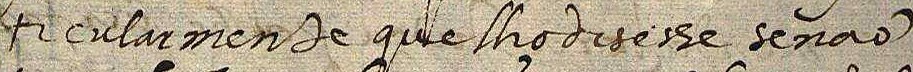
ticularmente que lho disesse senaõ
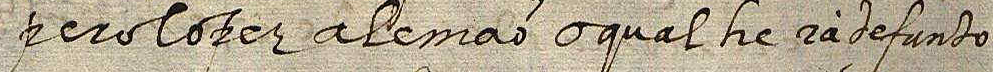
pero lopez alemaõ o qual he ia defunto
